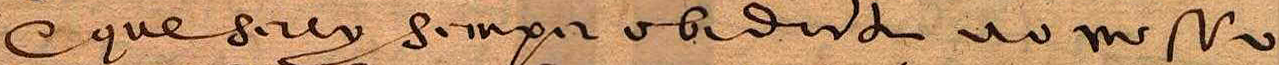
e que serey semper obediēte ao nosso
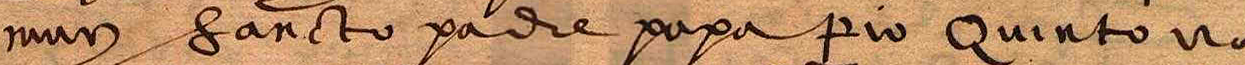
muy sancto padre papa pio Quinto ora
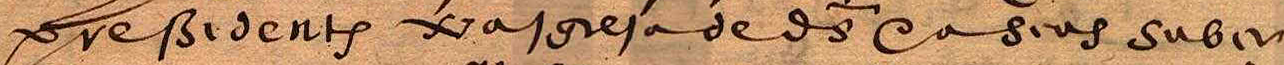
pressidentꝭ Na jgreja de ds̄ e a seus subce
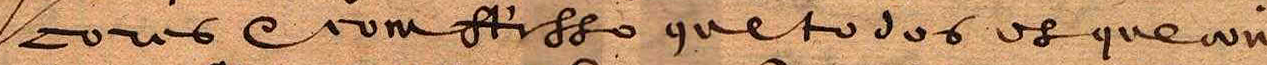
çores e comfesso que todos os que con
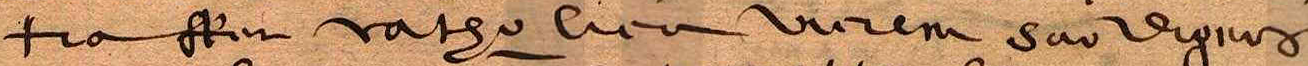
tra fee catholica vierem saõ dignos
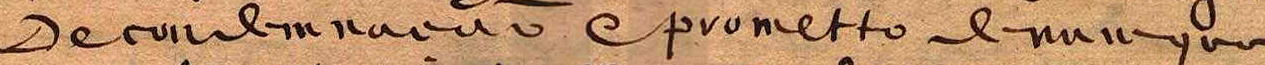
De condemnaçaõ e prometto de numqua
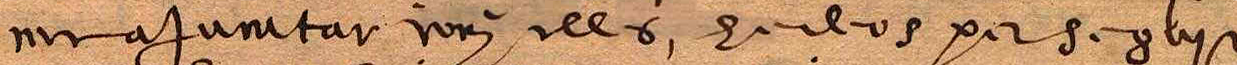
me aJuntar com elles, he de os persegujr
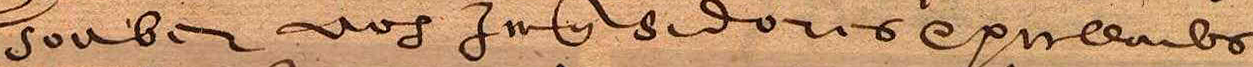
souber aos Jmq̄sidores e prellados
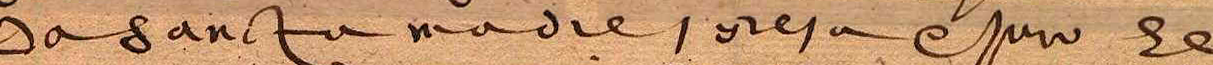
Da sancta madre jgreja e juro he
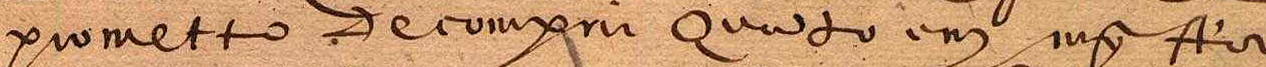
prometto De comprir Quāto em mȳ ffor
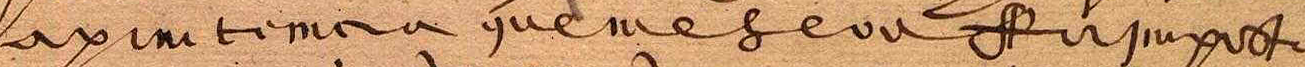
a pinitemcia que me he ou ffor jmposta
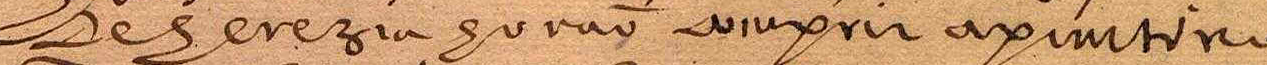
De herezia he naõ comprir a pinitēcia
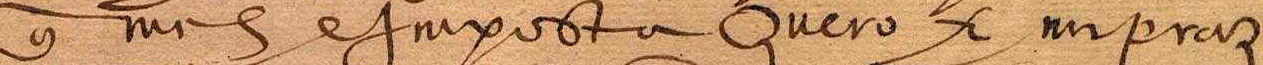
q̄ me he Jmposta Quero e me praz
